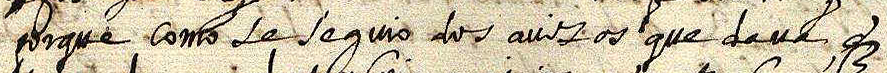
porque como se seguio dos auizos que daua e
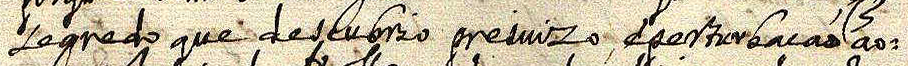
segredo que descubrio preiuizo, e perturbaçaõ ao
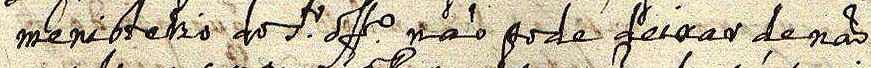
menisterio do s.to off.o naõ pode deixar de naõ
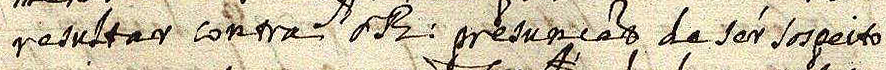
resultar contra o R: presunçaõ de ser sospeito
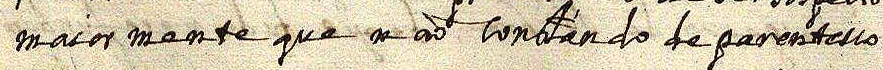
maiormente que naõ constando de parentesco
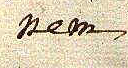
nem
